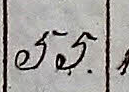55.
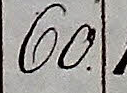60.
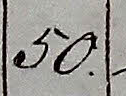50.
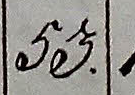53.
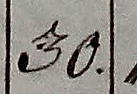30.
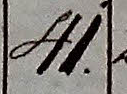41.
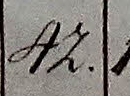42.
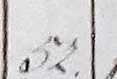52.
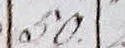50.
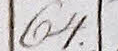64.
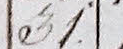31.
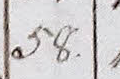58.
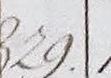29.
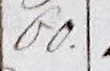60.
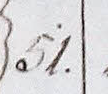51.
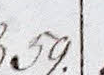59.
